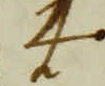4
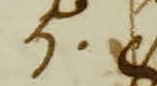5.
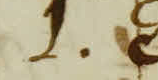1.
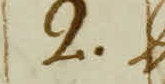2.
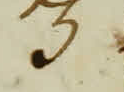3
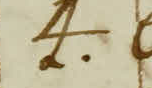4.
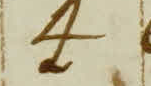4
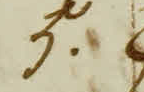5.
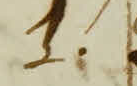1.
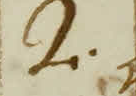2.
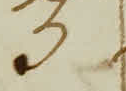3
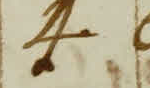4
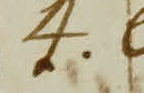4.
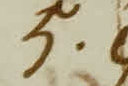5.
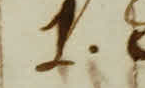1.
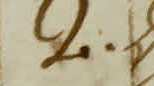2.
